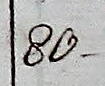80
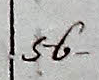56
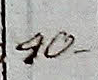40
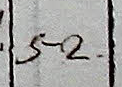52.
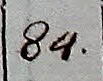84.
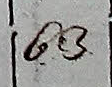63
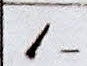1
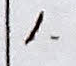1
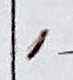1
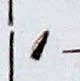1
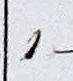1
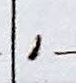1
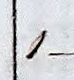1
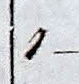1
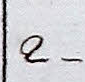2
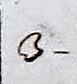3
